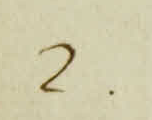2.
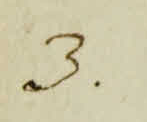3.
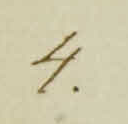4.
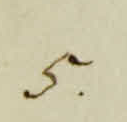5.
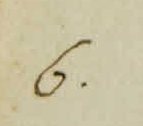6.
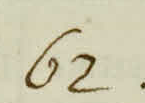62
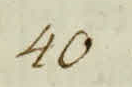40
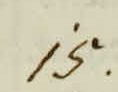15
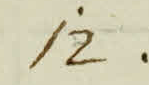12
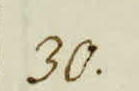30.
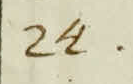24
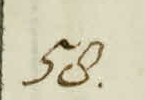58.
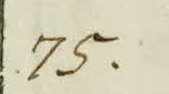75.
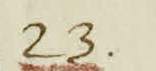23.
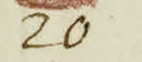20
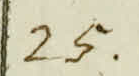25.
